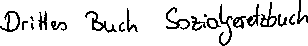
Drittes Buch Sozialgesetzbuch
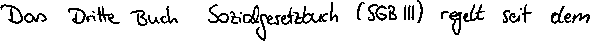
Das Dritte Buch Sozialgesetzbuch (SGB III) regelt seit dem
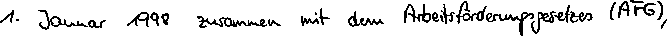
1. Januar 1998 zusammen mit dem Arbeitsförderungsgesetzes (AFG),
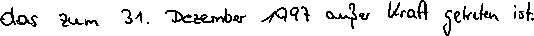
das zum 31. Dezember 1997 außer Kraft getreten ist.
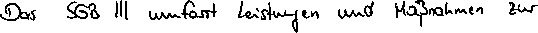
Das SGB III umfasst Leistungen und Maßnahmen zur
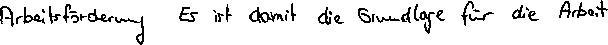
Arbeitsförderung. Es ist damit die Grundlage für die Arbeit
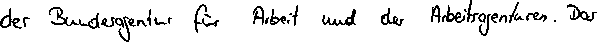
der Bundesagentur für Arbeit und der Arbeitsagenturen. Das
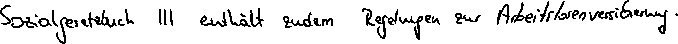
Sozialgesetzbuch III enthält zudem Regelungen zur Arbeitslosenversicherung.
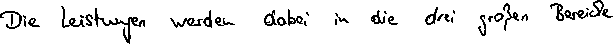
Die Leistungen werden dabei in die drei großen Bereiche
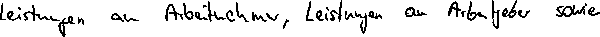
Leistungen an Arbeitnehmer, Leistungen an Arbeitgeber sowie
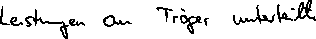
Leistungen an Träger unterteilt
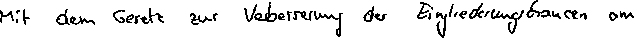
Mit dem Gesetz zur Verbesserung der Eingliederungschancen am
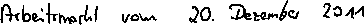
Arbeitsmarkt vom 20. Dezember 2011
